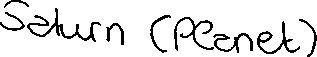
Saturn (Planet)
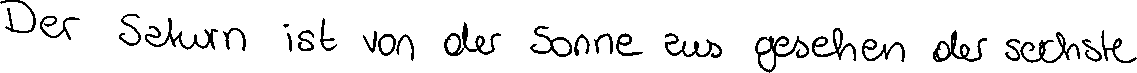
Der Saturn ist von der Sonne aus gesehen der sechste
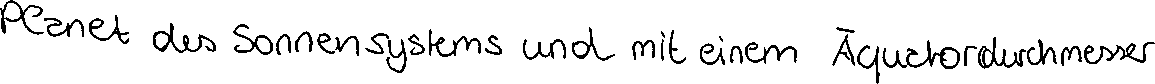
Planet des Sonnensystems und mit einem Äquatordurchmesser
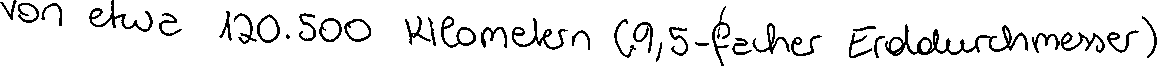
von etwa 120.500 Kilometern (9,5-facher Erddurchmesser)
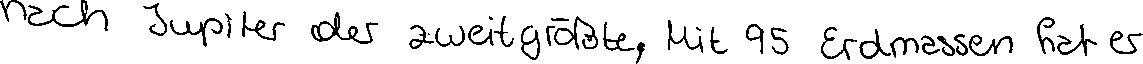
nach Jupiter der zweitgrößte. Mit 95 Erdmassen hat er
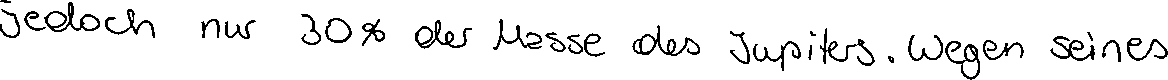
jedoch nur 30 % der Masse Jupiters. Wegen seines
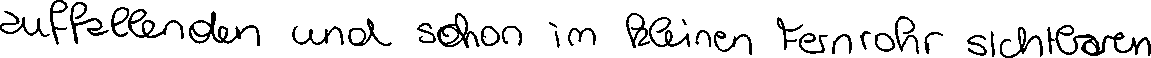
auffallenden und schon im kleinen Fernrohr sichtbaren
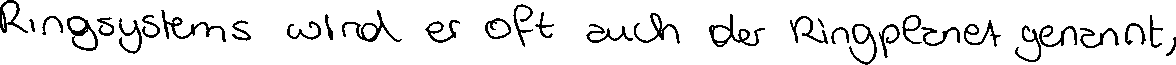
Ringsystems wird er oft auch der Ringplanet genannt
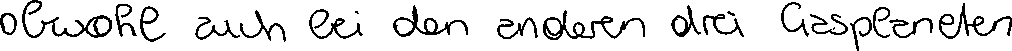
obwohl auch bei den anderen drei Gasplaneten
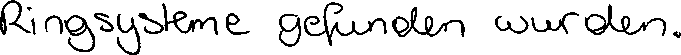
Ringsysteme gefunden wurden.
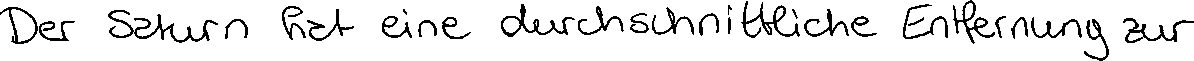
Der Saturn hat eine durchschnittliche Entfernung zur
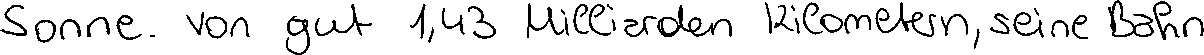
Sonne von gut 1,43 Milliarden Kilometern, seine Bahn
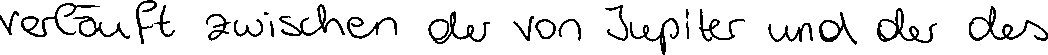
verläuft zwischen der von Jupiter und der des
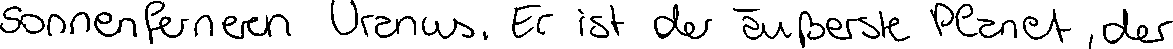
sonnenferneren Uranus. Er ist der äußerste Planet, der
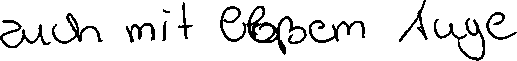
auch mit bloßem Auge
